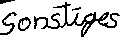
Sonstiges
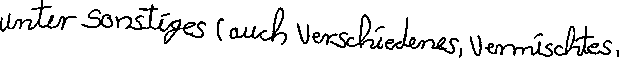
Unter Sonstiges (auch Verschiedenes, Vermischtes,
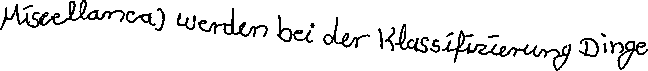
Miscellanea) werden bei der Klassifizierung Dinge
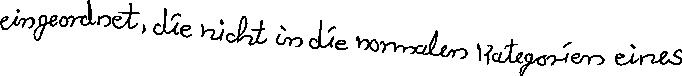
eingeordnet, die nicht in die normalen Kategorien eines
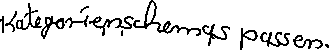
Kategorienschemas passen.
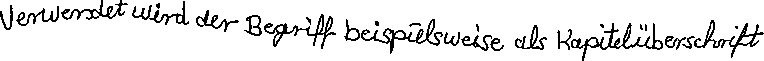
Verwendet wird der Begriff beispielsweise als Kapitelüberschrift
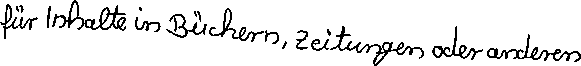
für Inhalte in Büchern, Zeitungen oder anderen
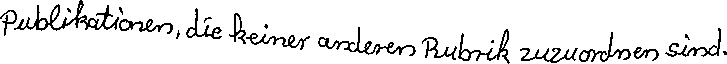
Publikationen, die keiner anderen Rubrik zuzuordnen sind.
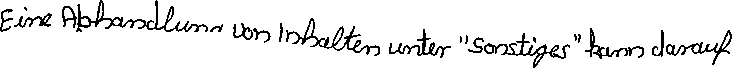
Eine Abhandlung von Inhalten unter "Sonstiges" kann darauf
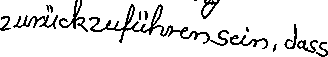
zurückzuführen sein, dass
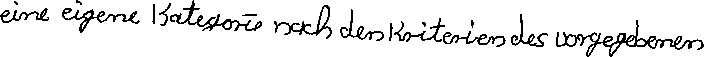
eine eigene Kategorie nach den Kriterien des vorgegebenen
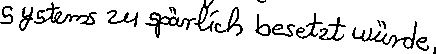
Systems zu spärlich besetzt würde,
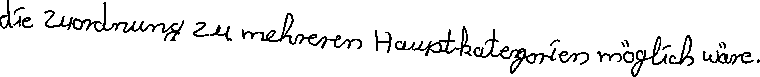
die Zuordnung zu mehreren Hauptkategorien möglich wäre.
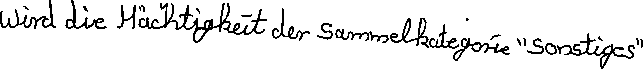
Wird die Mächtigkeit der Sammelkategorie "Sonstiges"
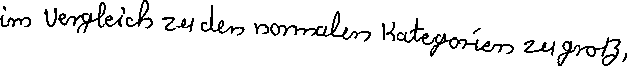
im Vergleich zu den normalen Kategorien zu groß,
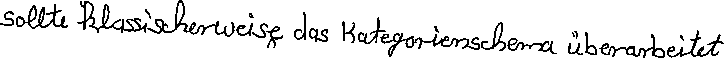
sollte klassischerweise das Kategorienschema überarbeitet
